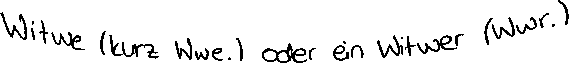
Witwe (kurz Wwe.) oder ein Witwer (Wwr.)
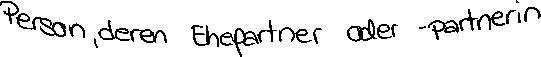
Person, deren Ehepartner oder -partnerin
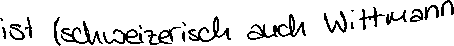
ist (schweizerisch auch Witmann
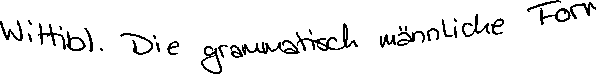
Wittib). Die grammatisch männliche Form
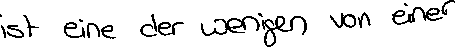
ist eine der wenigen von einer
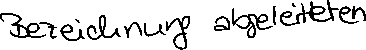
Bezeichnung abgeleiteten
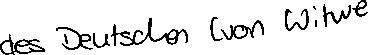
des Deutschen (von Witwe
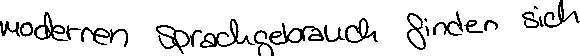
modernen Sprachgebrauch finden sich
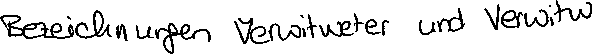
Bezeichnungen Verwitweter und Verwitw
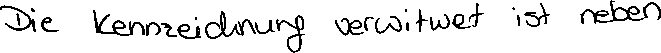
Die Kennzeichnung verwitwet ist neben
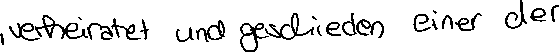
verheiratet und geschieden einer der
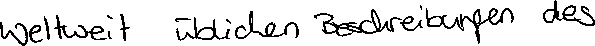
weltweit üblichen Beschreibungen des
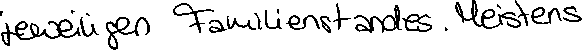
jeweiligen Familienstandes. Meistens
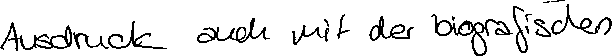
Ausdruck auch mit der biografischen
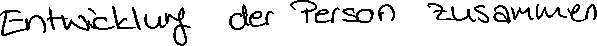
Entwicklung der Person zusammen
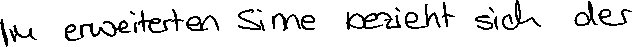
Im erweiterten Sinne bezieht sich der
